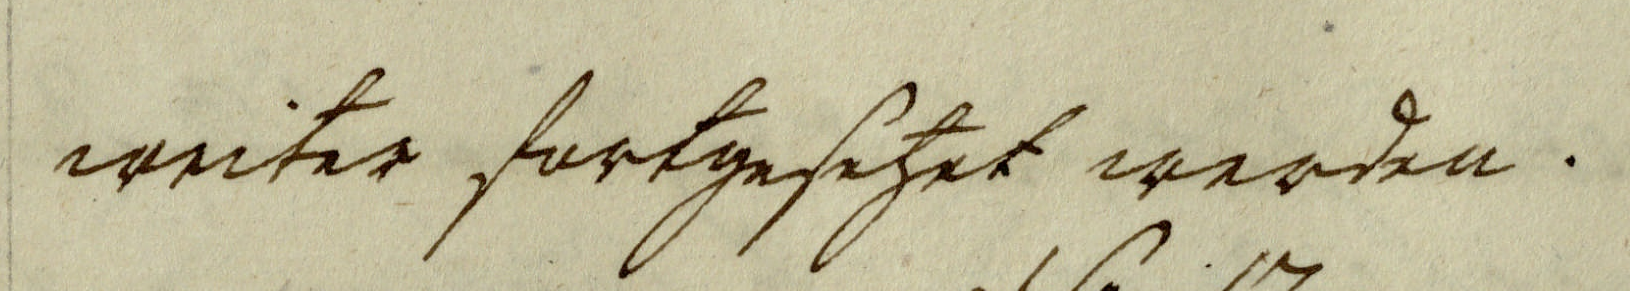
weiter fortgesetzet werden.
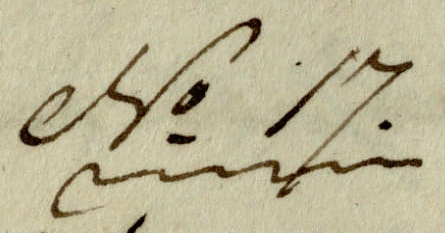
No 17 .
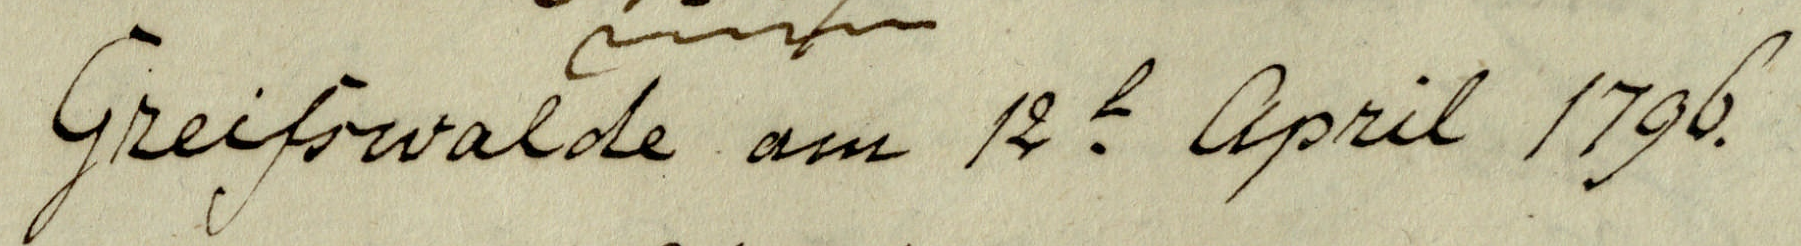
Greifswalde am 12 t April 1796.
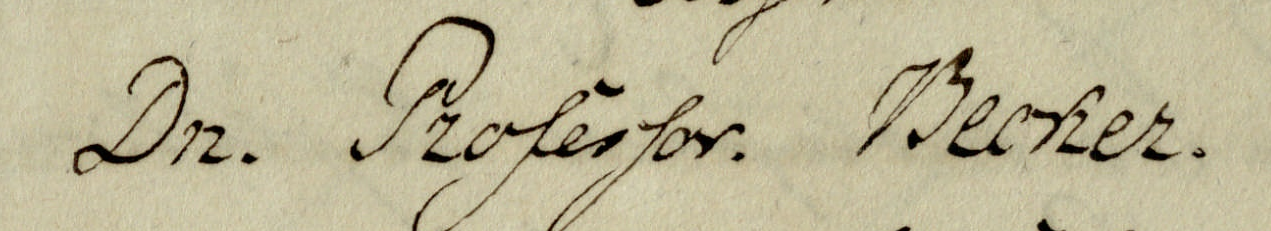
Dn. Professor Becker.
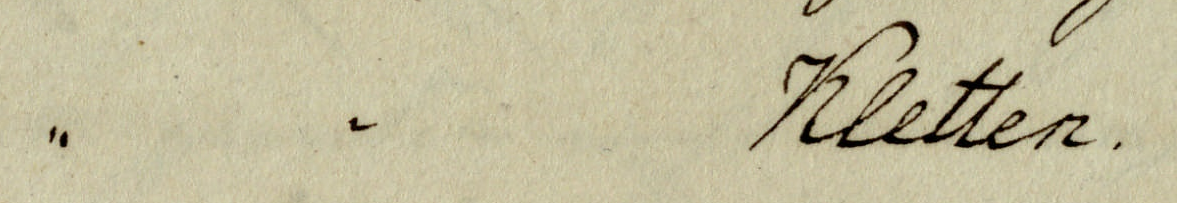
Kletten.
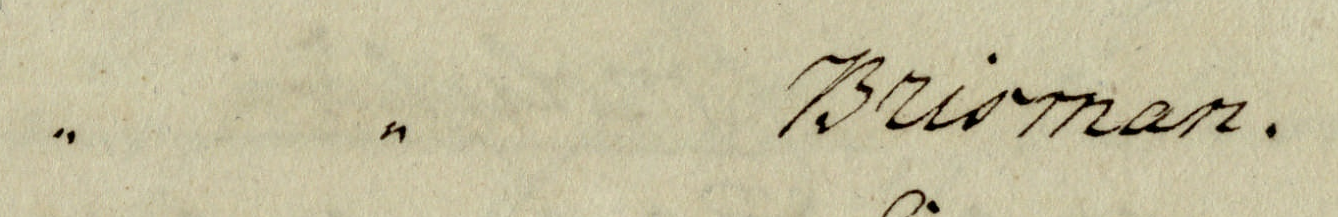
Brisman.
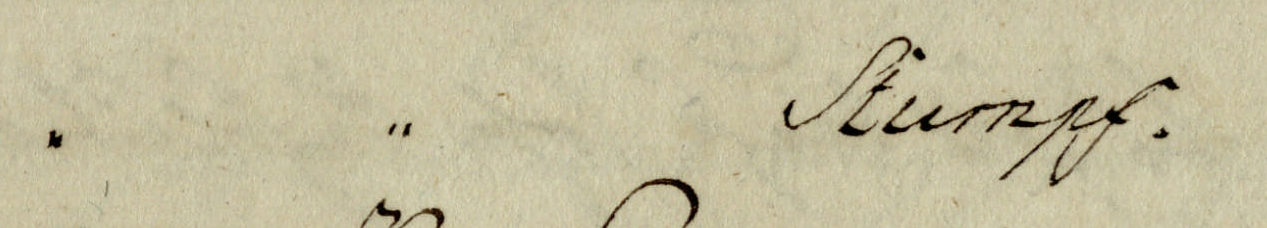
Stumpf.
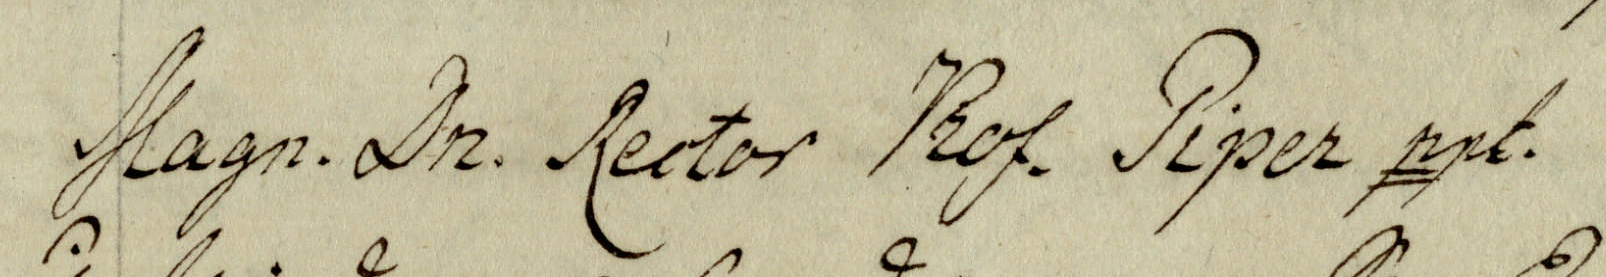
Magn. Dn. Rector Prof. Piper ppt
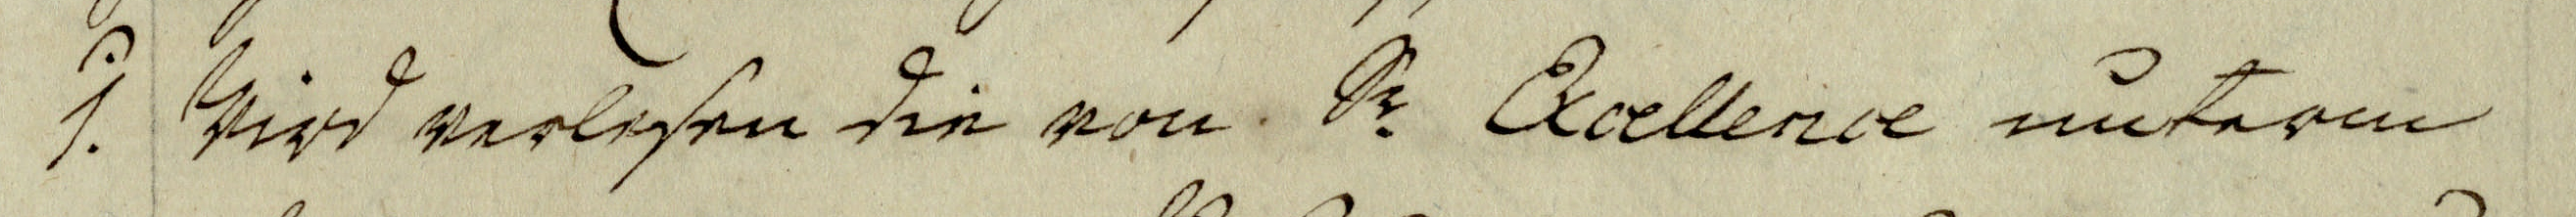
1. Wird verlesen die von Sr Excellence unterm
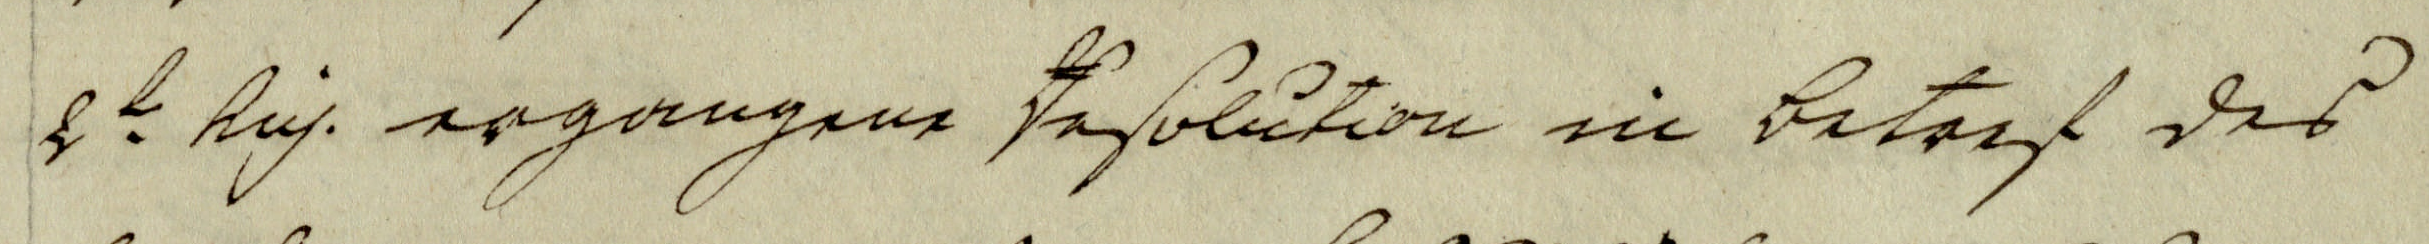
2. t. huj. ergangene Resolution in Betref des
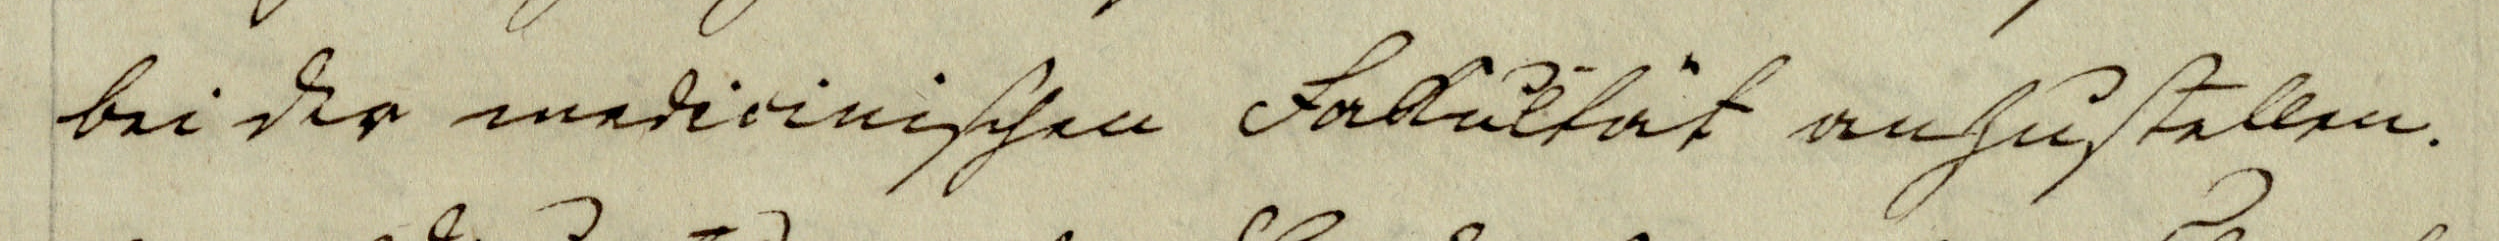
bei der medicinischen Fakultät anzustellen¬
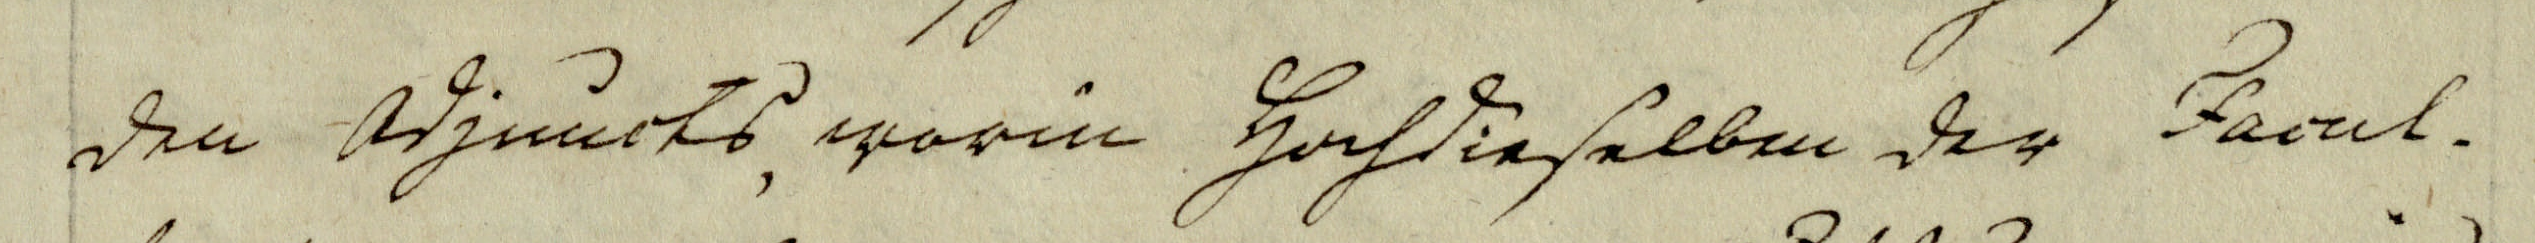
den Adjuncts, worin Hochdieselben der Facul¬
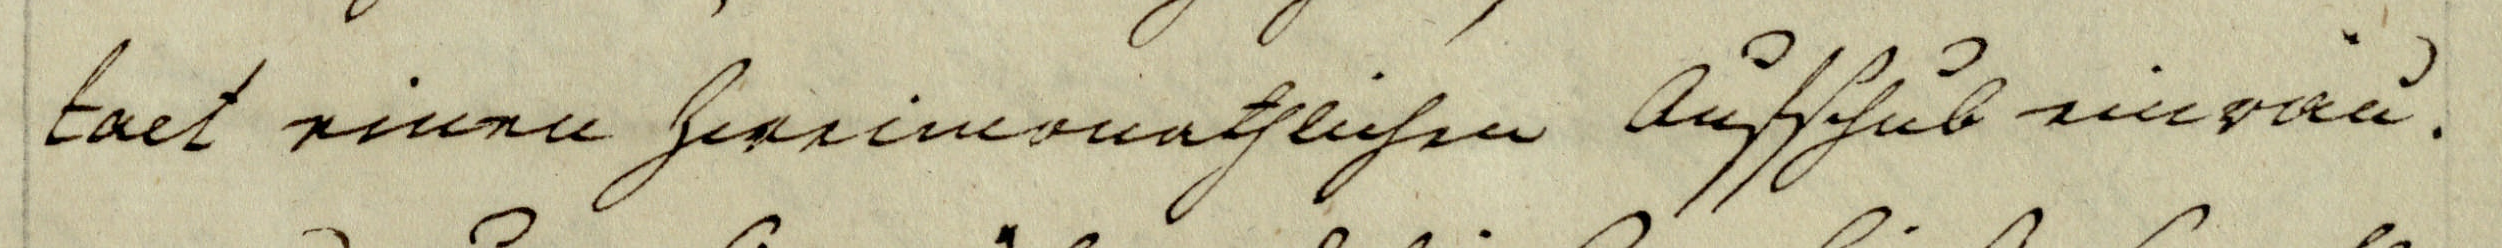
taet einen zweimonathlichen Aufschub einräu¬
